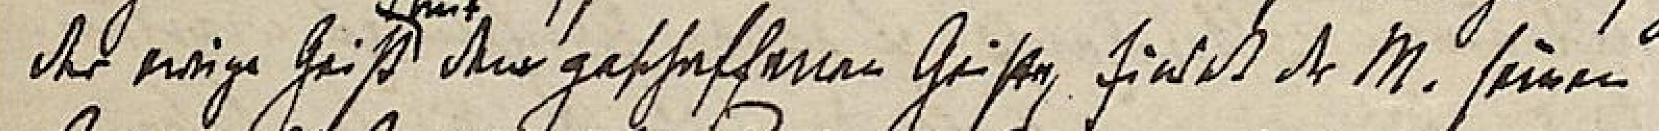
der ewige Geist dem geschaffenen Geist, findet dr M. seinen
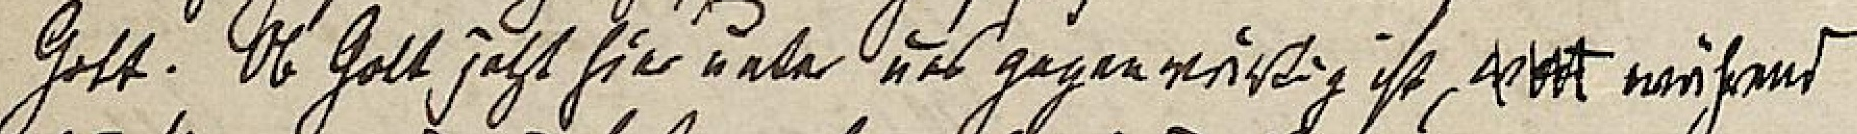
Gott. Ob Gott jetzt hier unter uns gegenwärtig ist, wo während
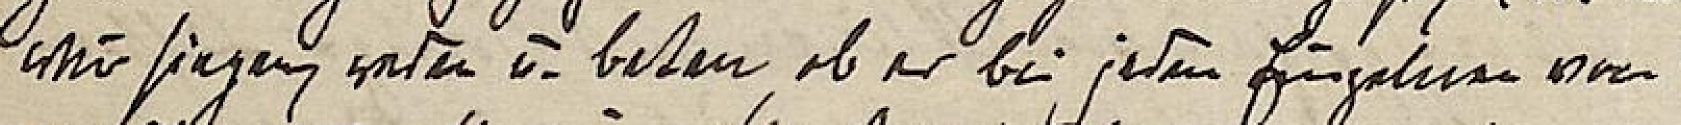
wir sinden, reden u. beten, ob er bei jedem Einzelnen von
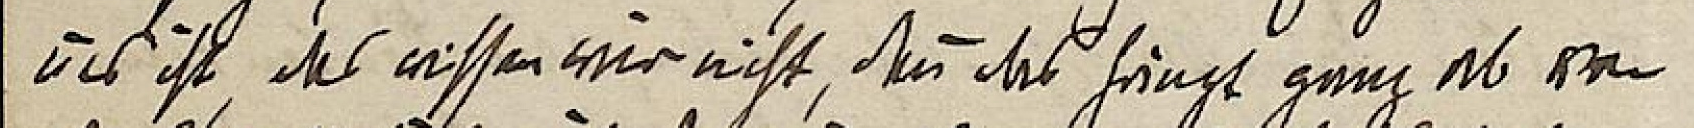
uns ist, das wissen wir nicht, den das hängt ganz ab von
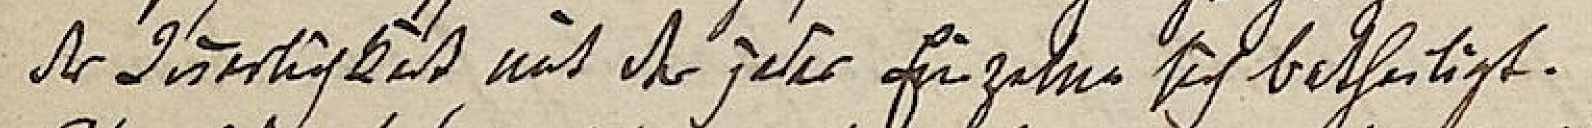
der Inerlichkeit mit der jeder Einzelne sich bethätigt.
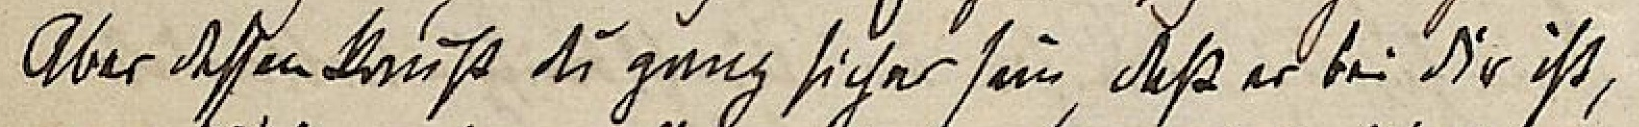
Aber dessen kanst du ganz sicher sein, daß er bei dir ist,
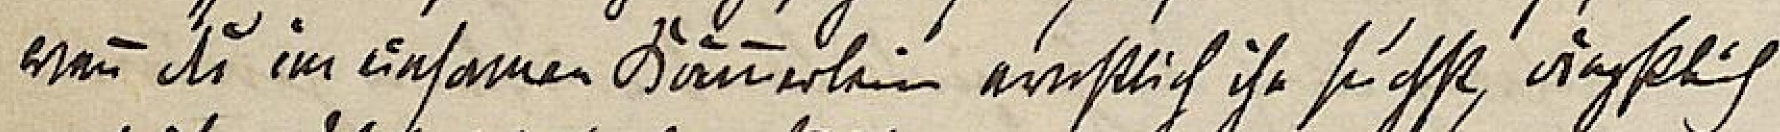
wen du im einsamen Kämerlein ernstlich ihn suchst, ängstlich
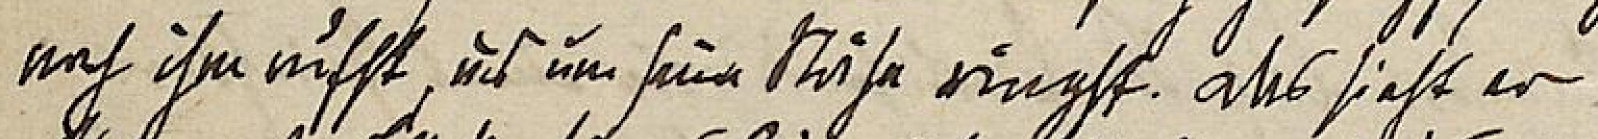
nach ihm rufst, und um seine Nähe ringst. Das sieht er
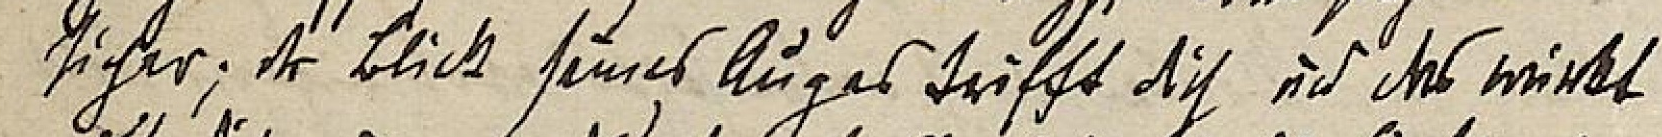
sicher; der Blick seiner Augen trifft dich und das wirkt
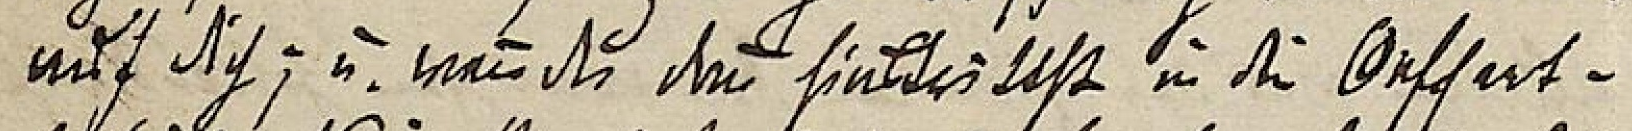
auf dich; u. wen du dan hinstrittst in die Oeffent¬
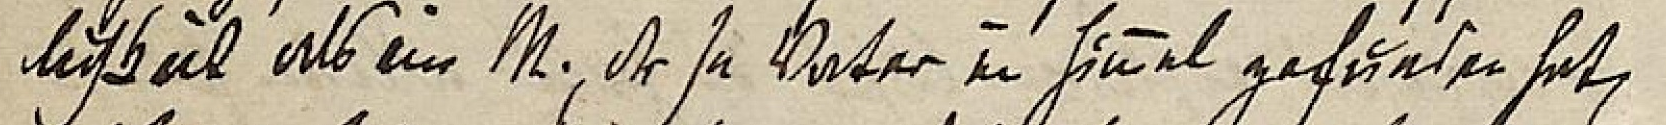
lichkeit als ein M., dr sn Vater im Himel gefunden hat,
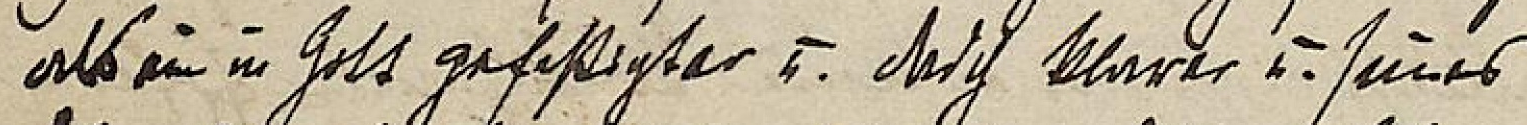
als ein in Gott gefestigter u. dadch klarer u. seines
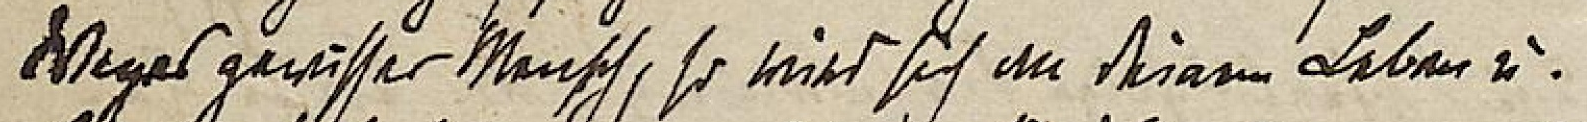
Weges gewisser Mensch, so wird sich an deinem Leben u.
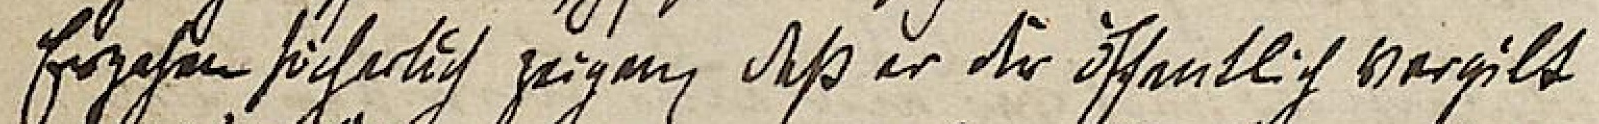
Ergehen sicherlich zeigen, daß er dir öffentlich vergilt
